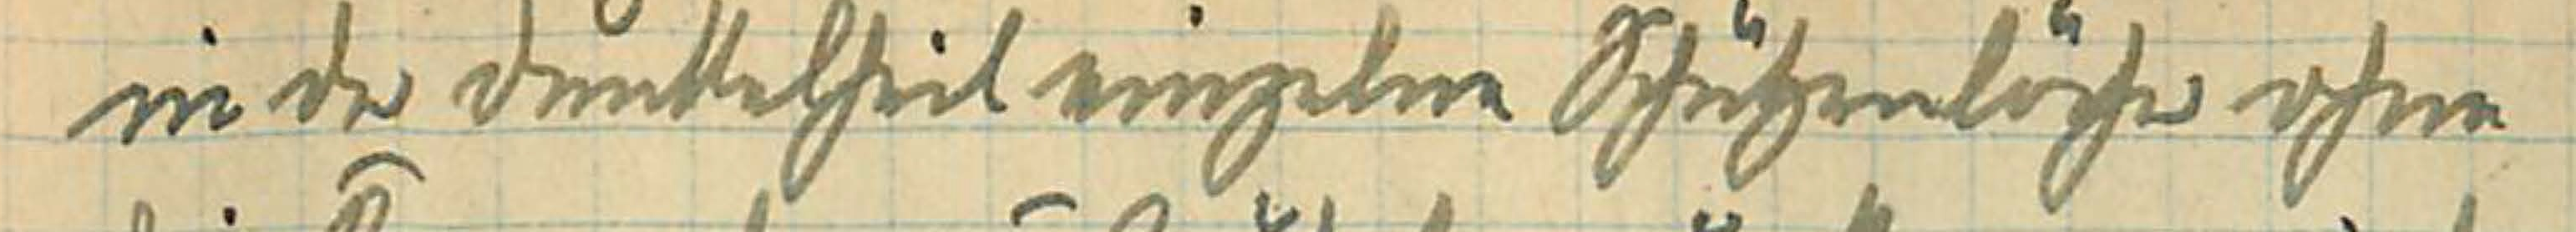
in der Dunkelheit einzelne Schützenlöcher ohne
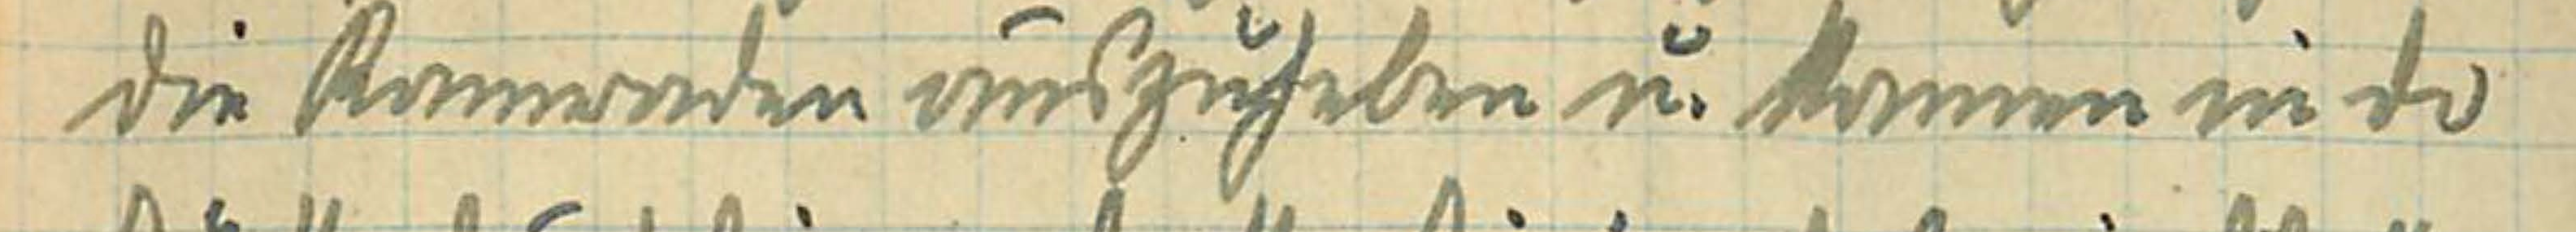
die Kameraden auszuheben u. kamen in der
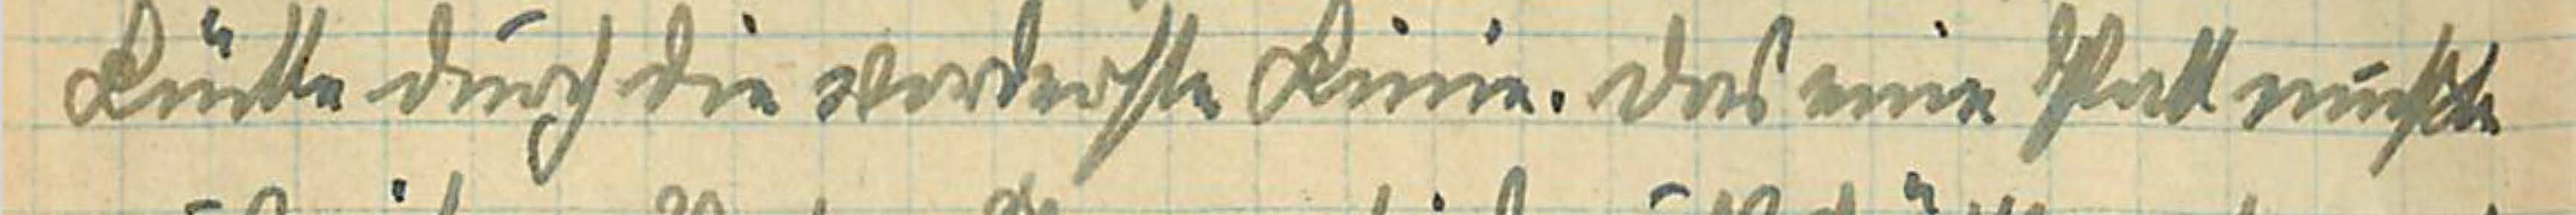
Lücke durch die vorderste Linie. Das eine Pak mußte
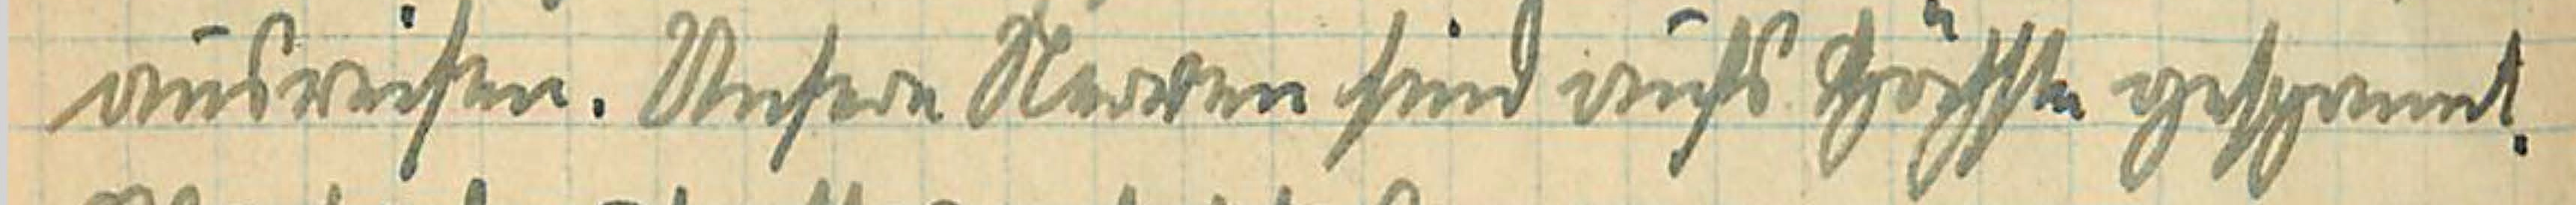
ausreisen. Unsere Nerven sind aufs Höchste gespannt.
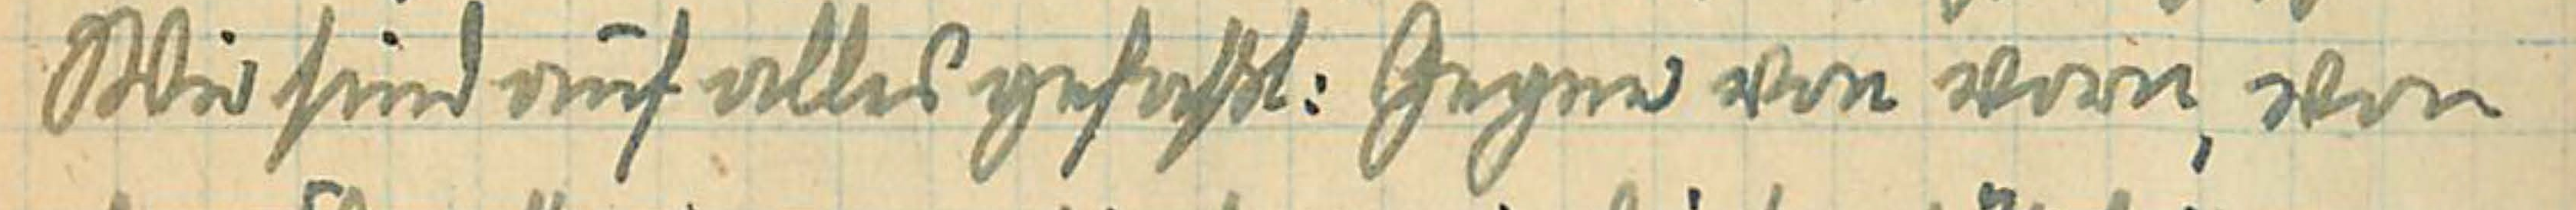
Wir sind auf alles gefaßt: Gegner von vorn, von
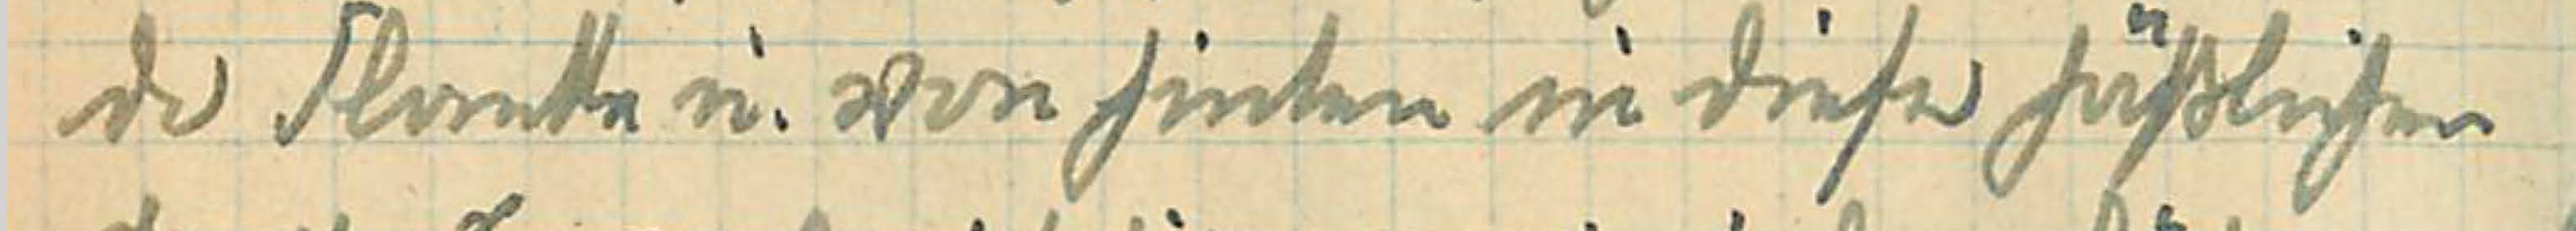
der Flanke u. von hinten in dieser häßlichen
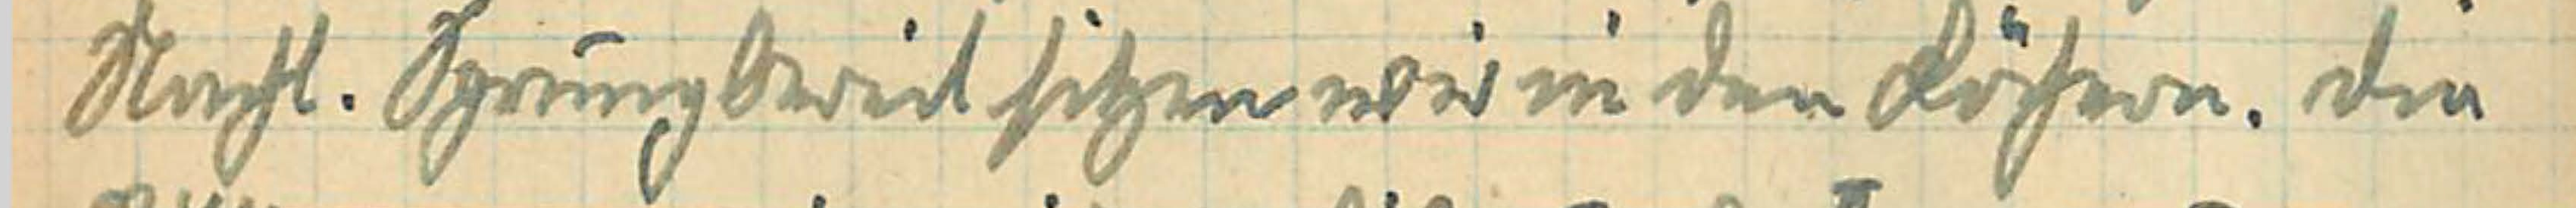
Nacht. Sprungbereit sitzen wir in den Löchern. Die
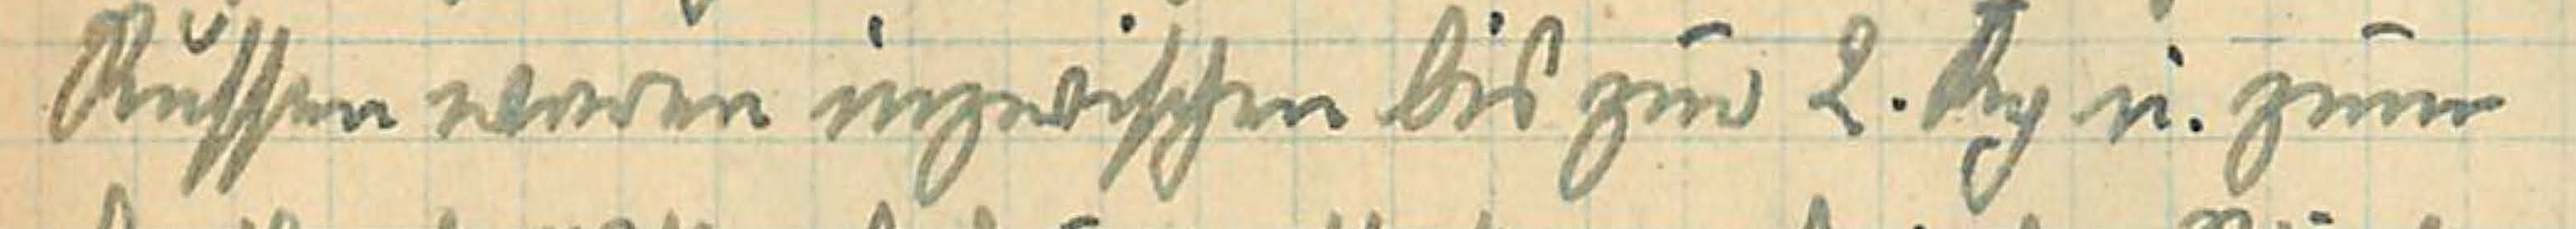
Russen waren inzwischen bis zur 2. Kp. u. zum
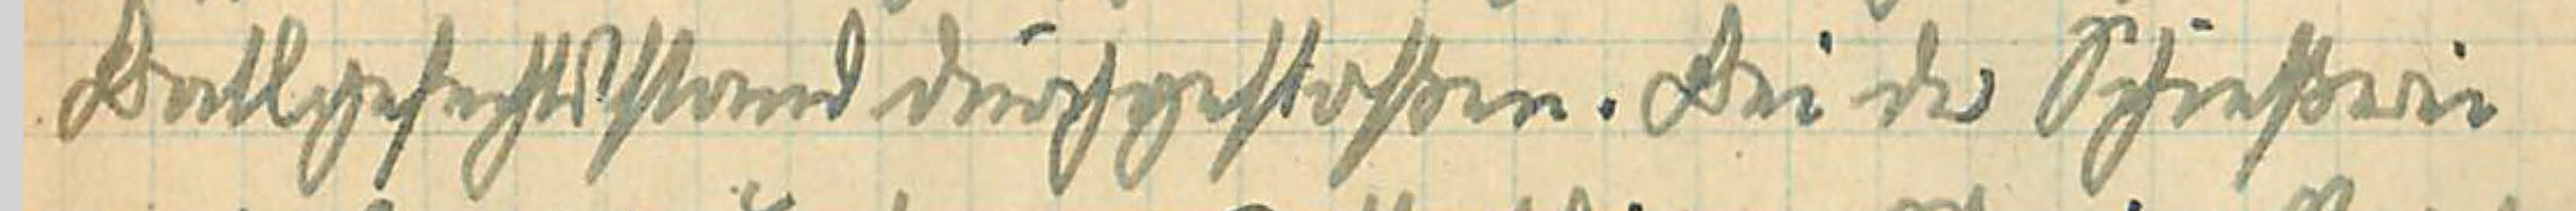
Batlgefechtsstand durchgestoßen. Bei der Schießerei
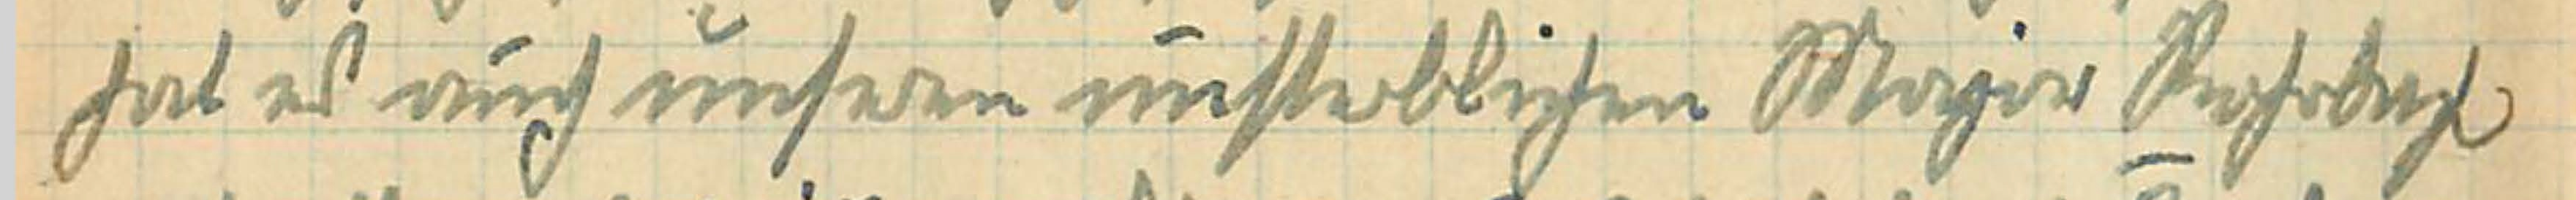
hat es auch unseren unsterblichen Major Rohrbacher
